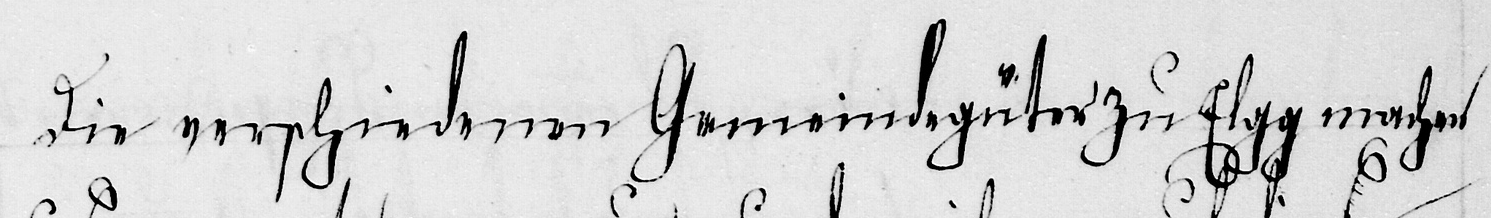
Die verschiedenen Gemeindegüter zu Elgg machen
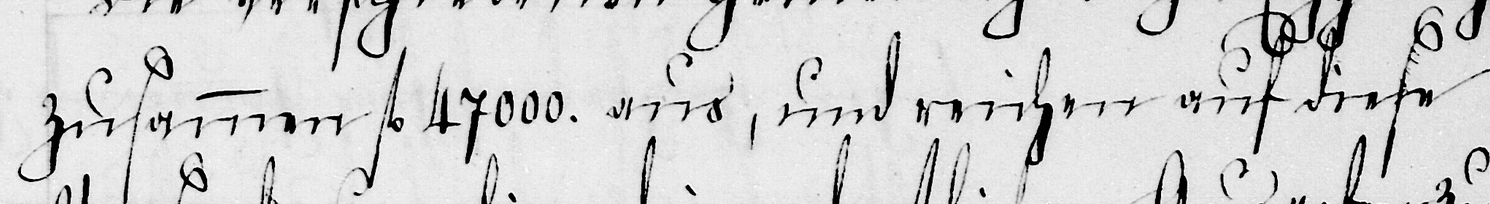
zusammen fl. 47 000. aus, und reichen auf diese
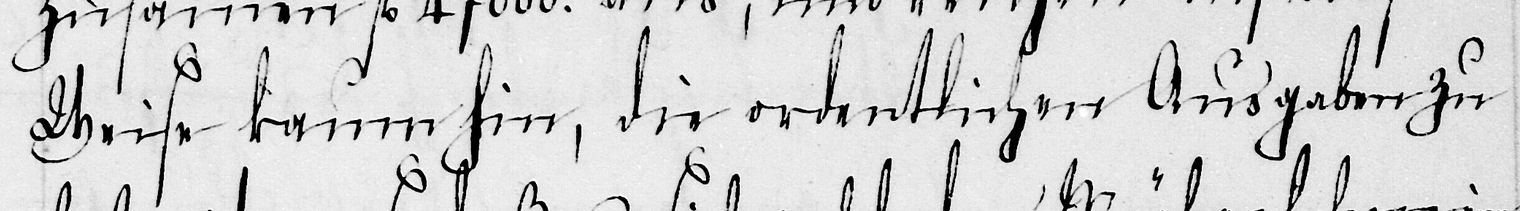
Weise kaum hin, die ordentlichen Ausgaben zu
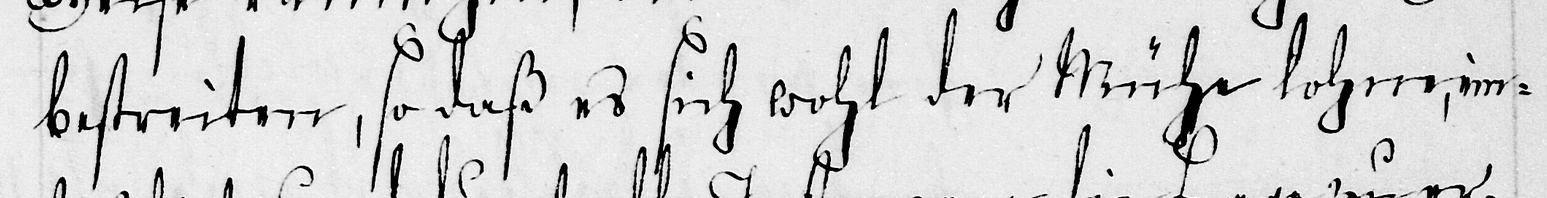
bestreiten, so daß es sich wohl der Mühe lohne, ei¬
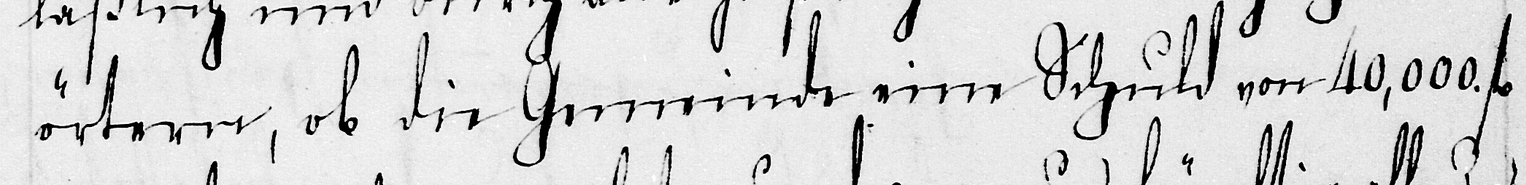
örtern, ob die Gemeinde eine Schuld von 40,000.
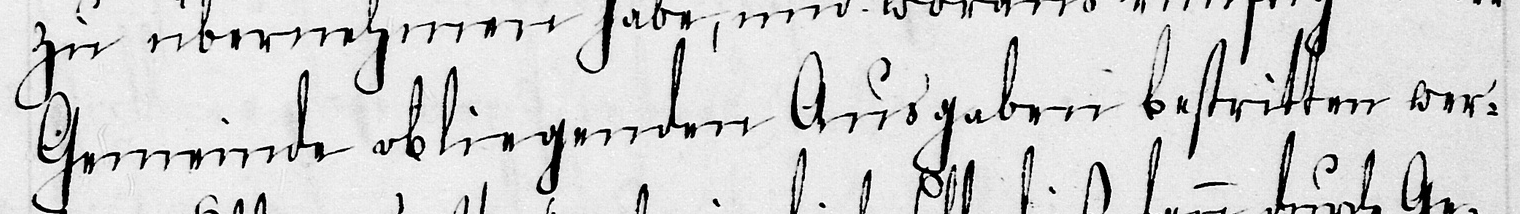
Gemeinde obliegenden Ausgaben bestritten wer¬
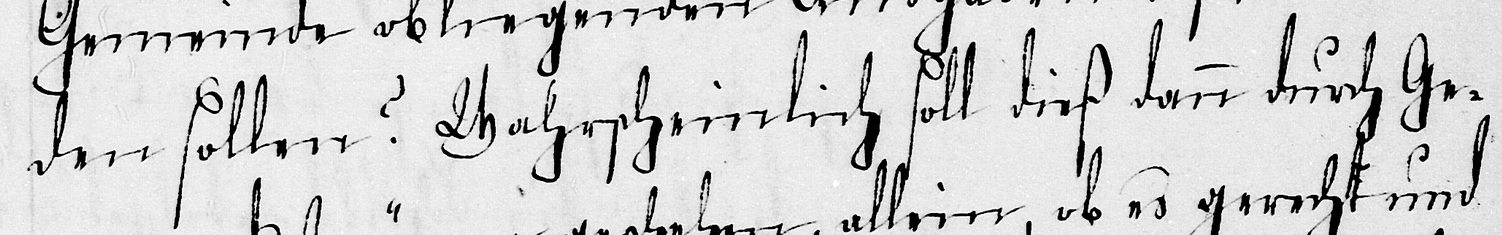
den sollen? Wahrscheinlich soll dieß dann durch Ge¬
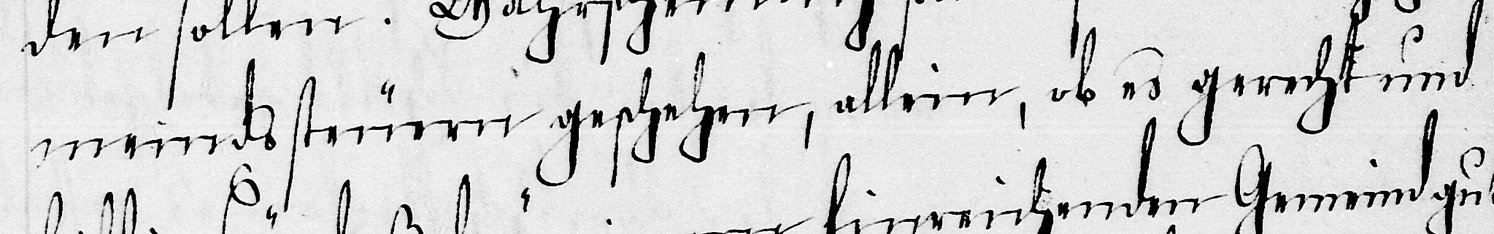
meindssteuern geschehen, allein, ob es gerecht und
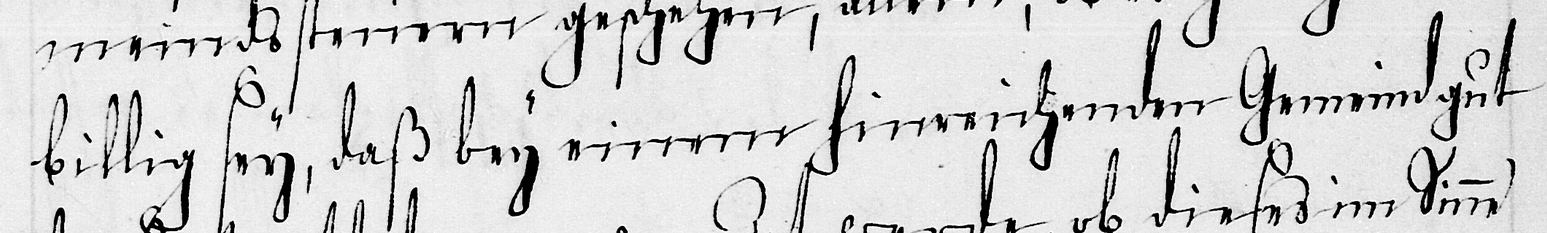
billig sey, daß bey einem hinreichenden Gemeindgut
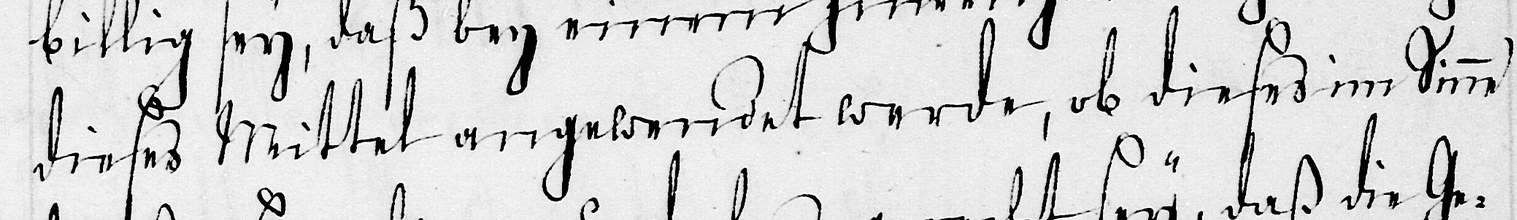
dieses Mittel angewendet werde, ob dieses im Sin¬
